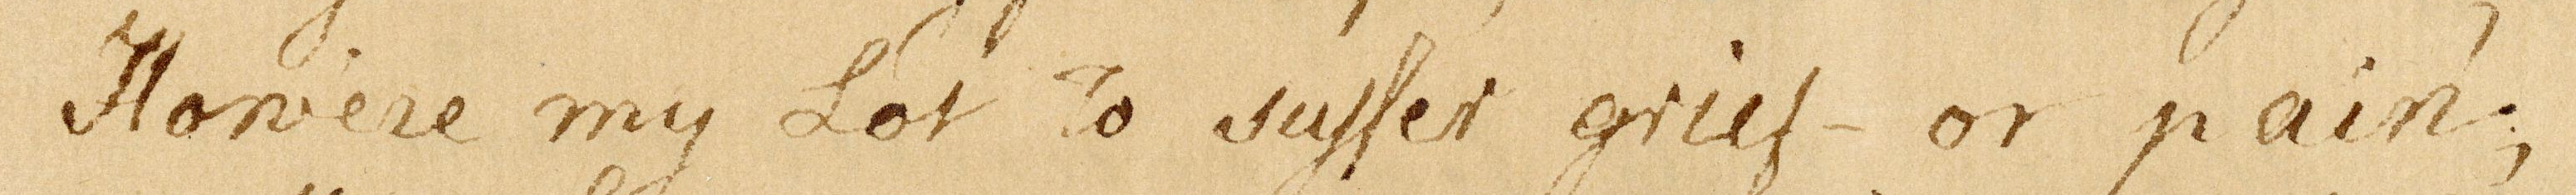Howere my Lot to suffer grief-or pain,
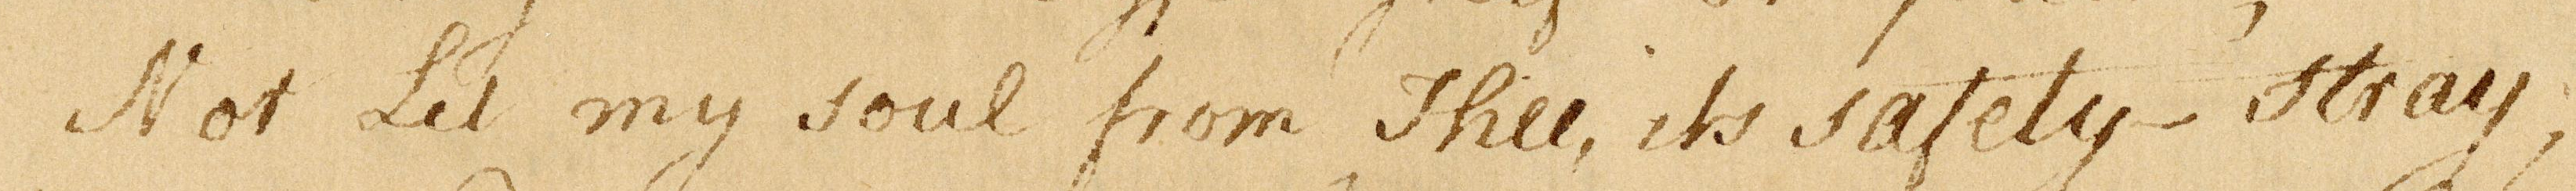Not Let my soul from thee, its safety- stray,
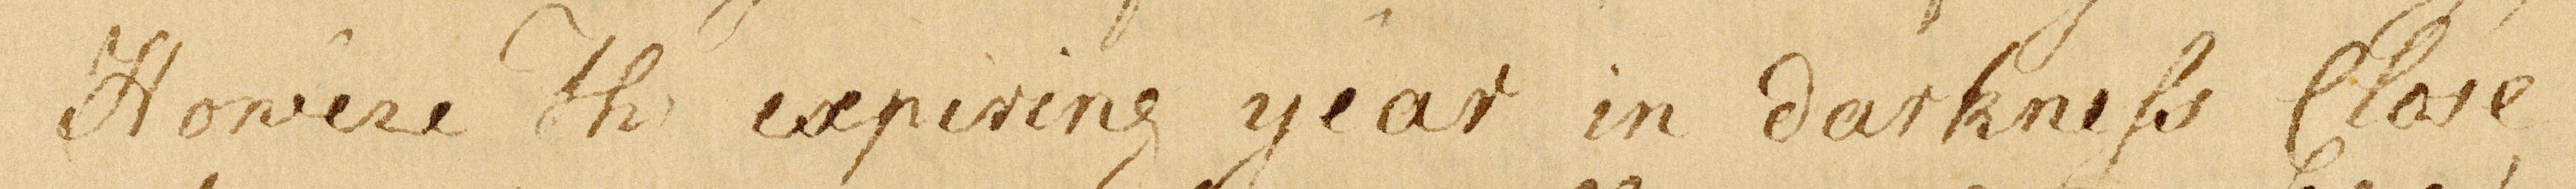Howere th expiring year in darkness Close
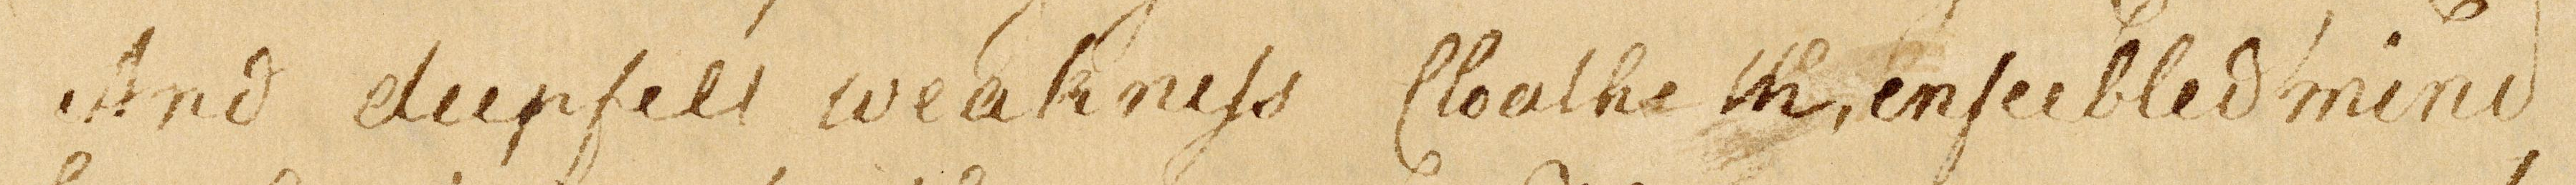And deepfelt weakness Cloathe th, enfeebled mind,
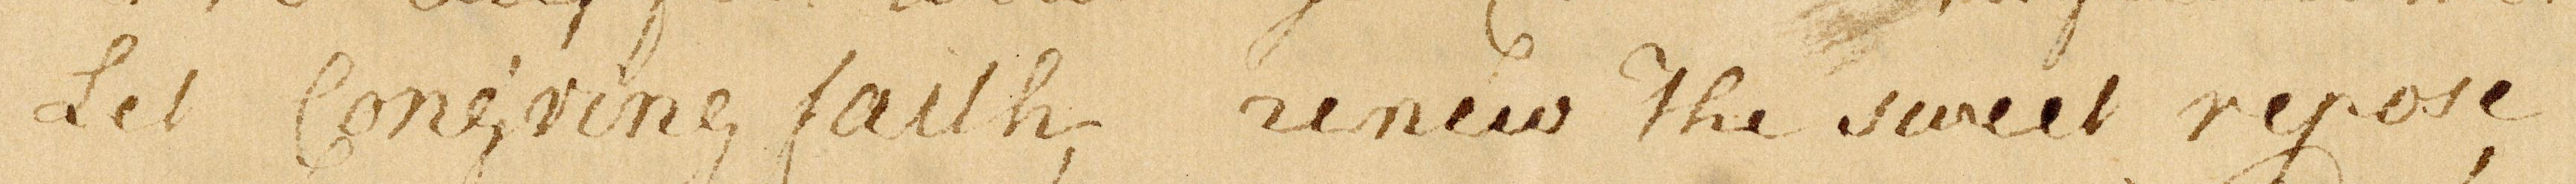Let [forgiving] faith renew the sweet repose,
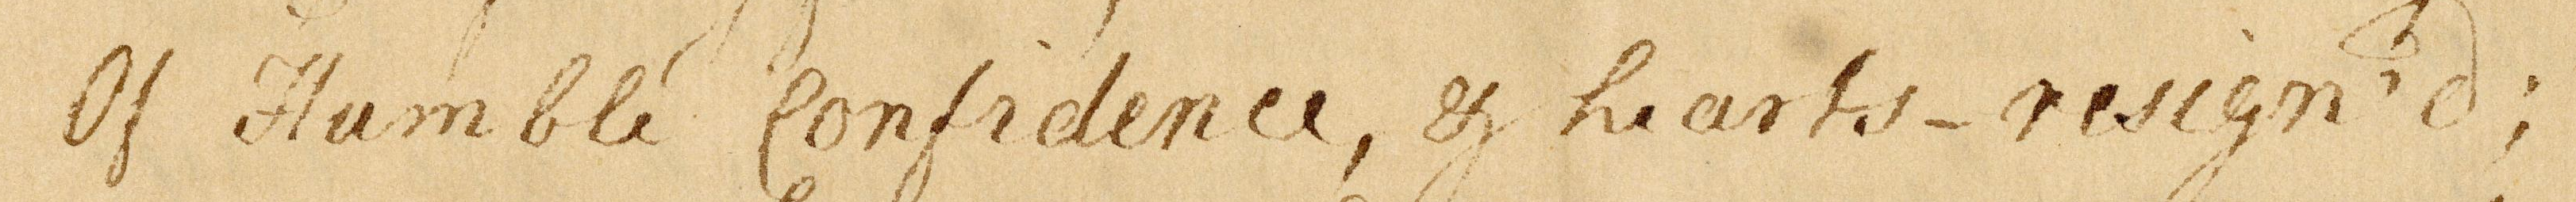Of Humble Confidence, & hearts- resign'd;
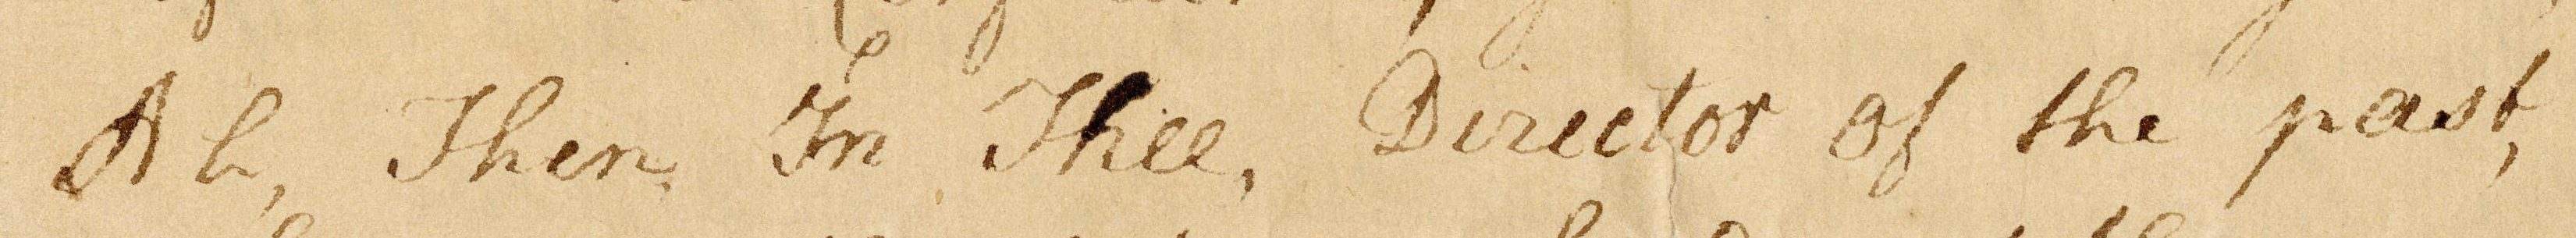Ah, Then In Thee, Director of the past,
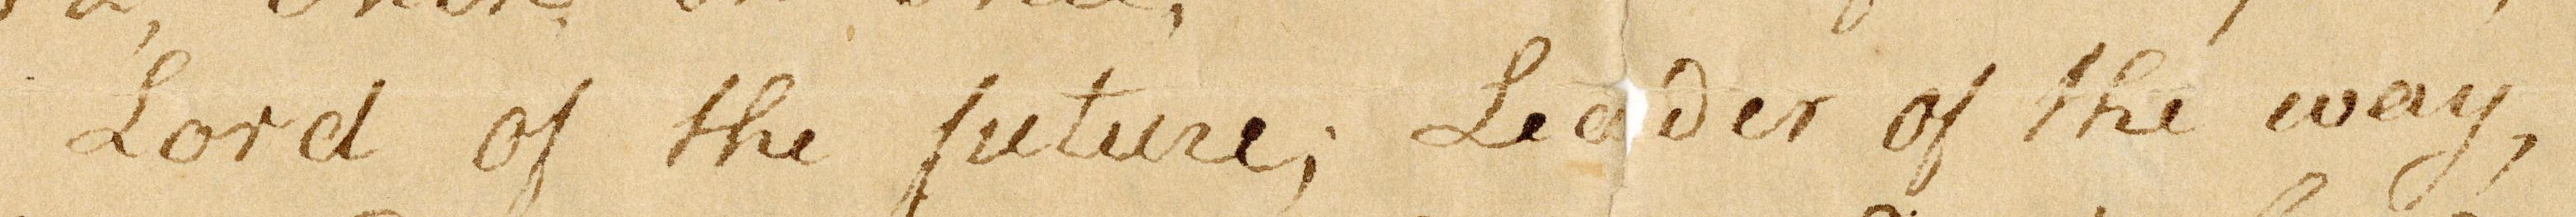Lord of the future; Leader of the way,
